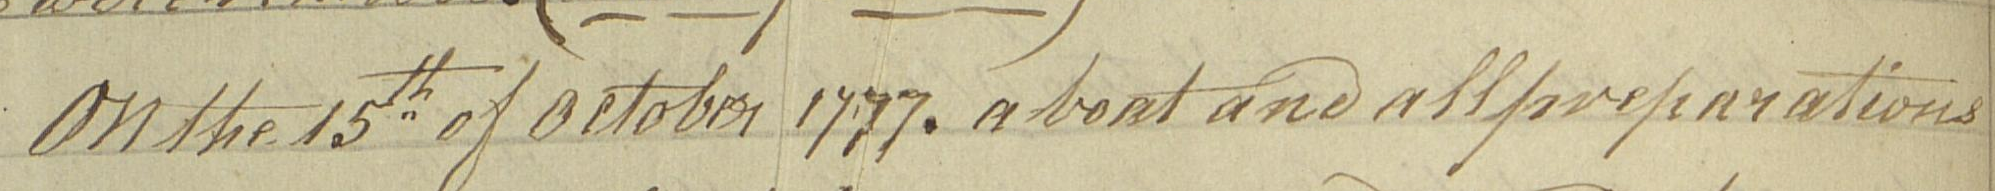On the 15^th. of October 1777. about and all preparations
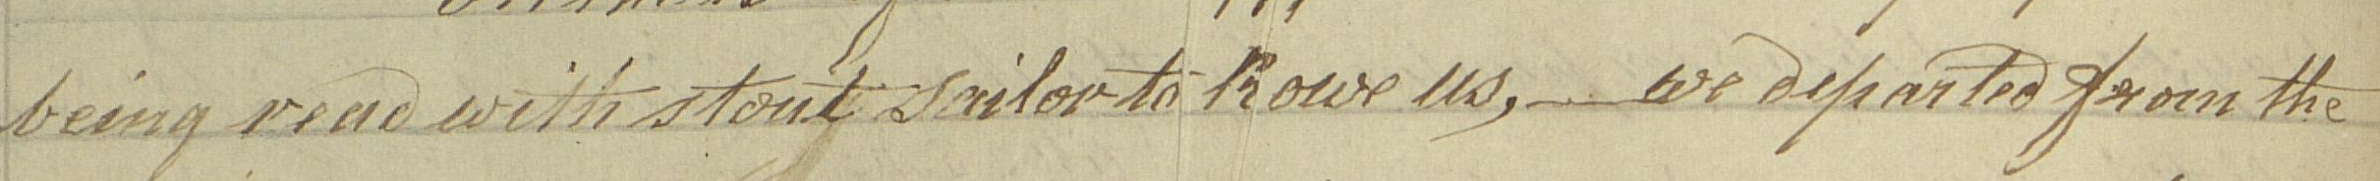being read with stout sailor to Rowe us, we departed from the
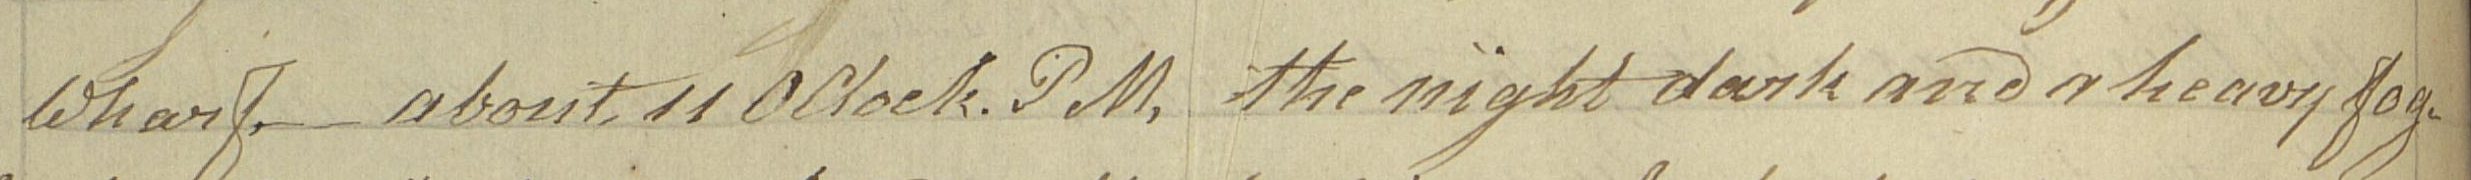wharf. about 11 OClock. PM. the night dark and a heavy fog.
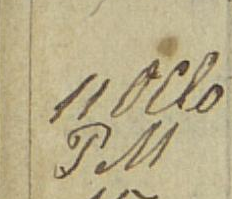11 OClo
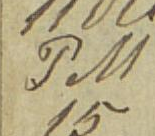PM
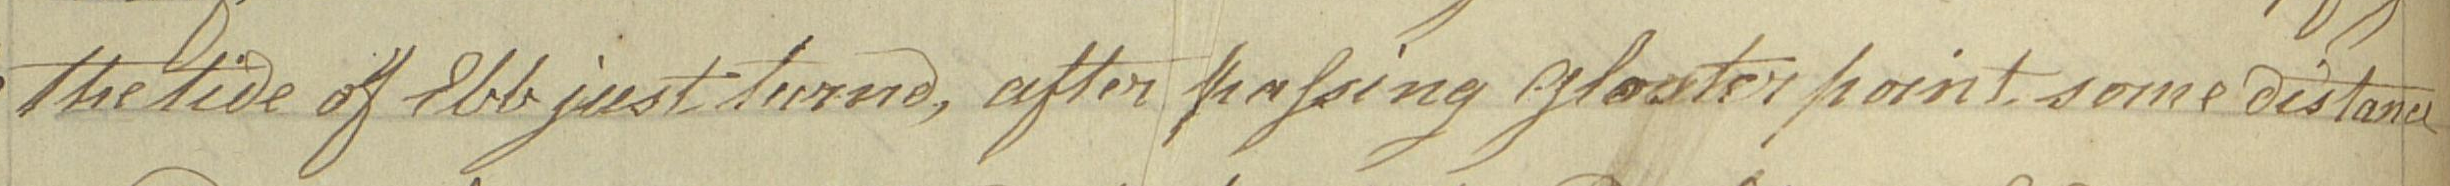the tide of Ebb just turnd, after passing gloster point some distance
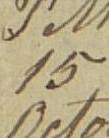15
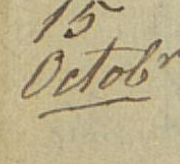Octob^r
